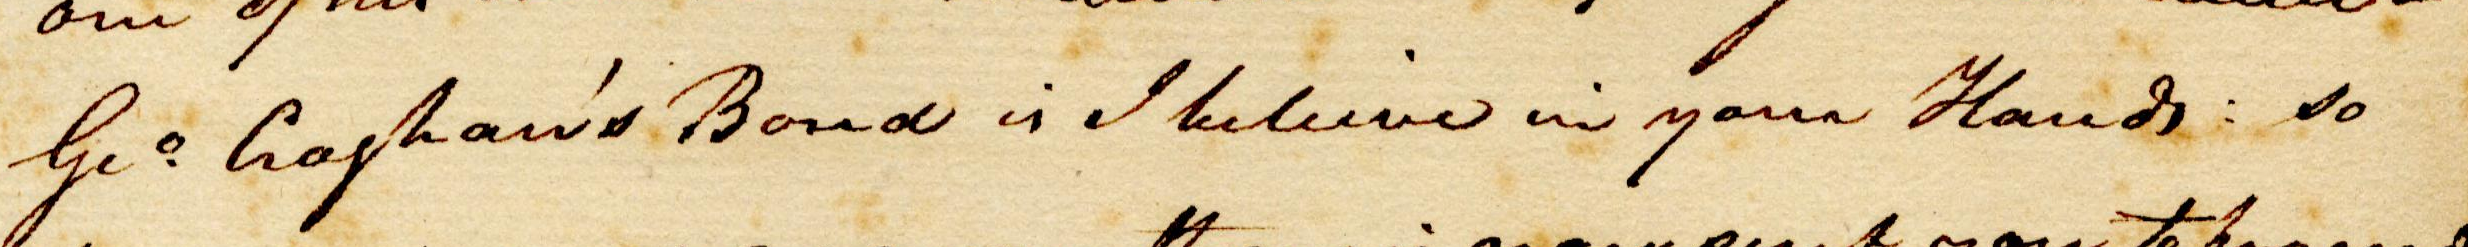Ge^o. Croghan's Bond is I believe in your Hands: so
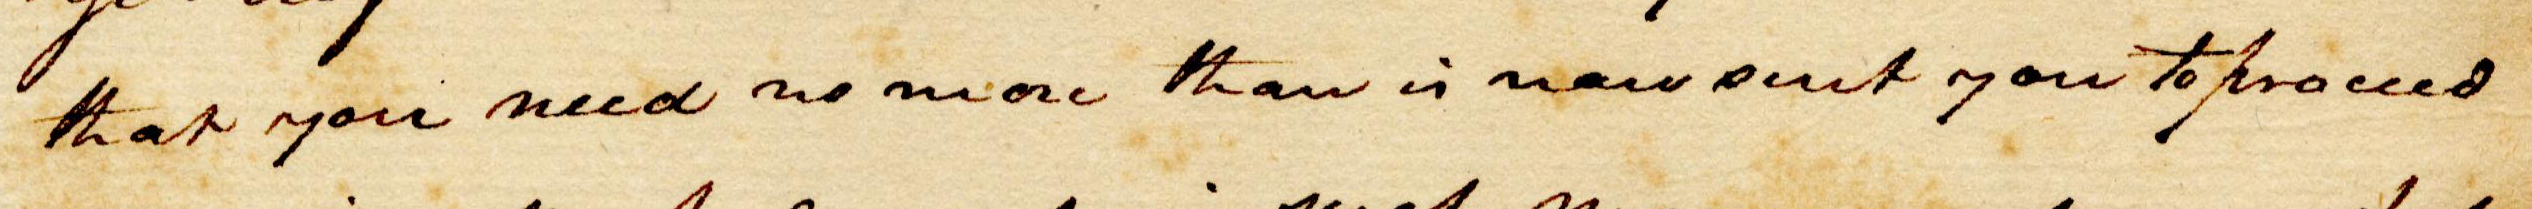that you need no more than I now sent you to proceed
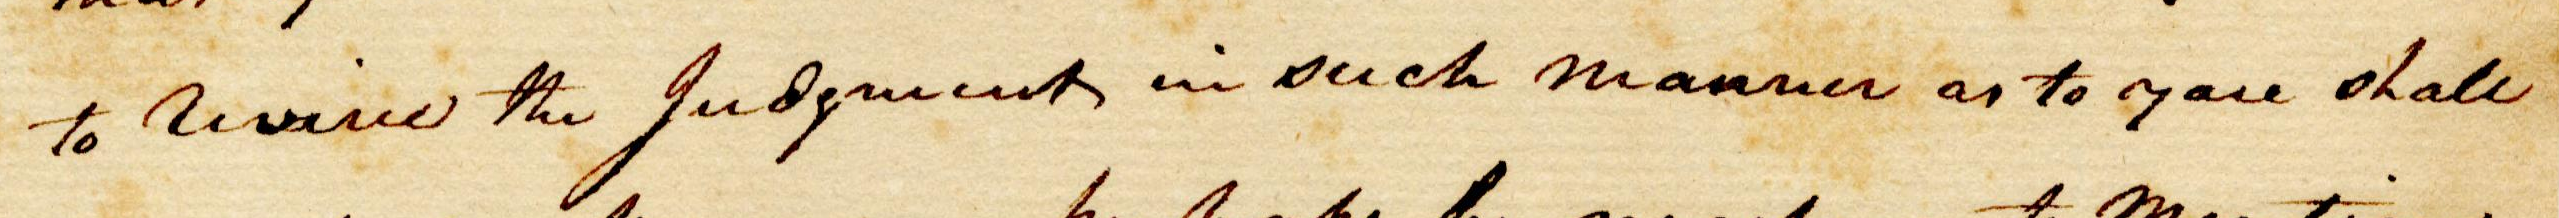to revive the Judgement in such manner as to you shall
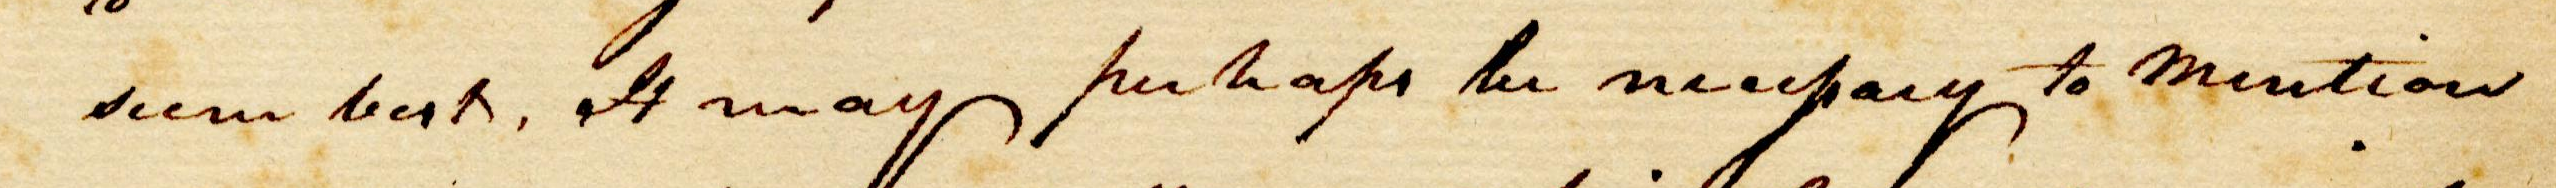seem best. It may perhaps be necessary to mention
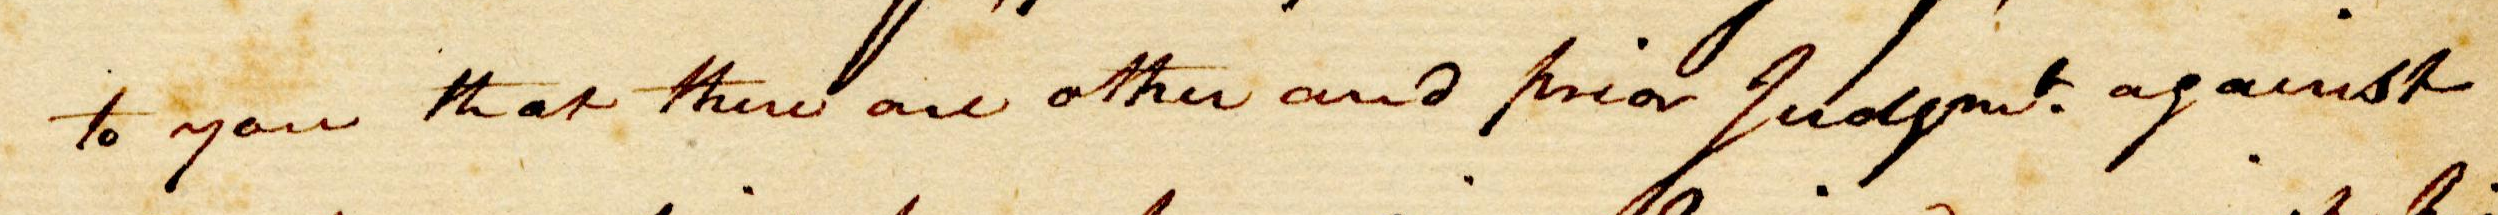to you that there are other and prior Judgm^t. against
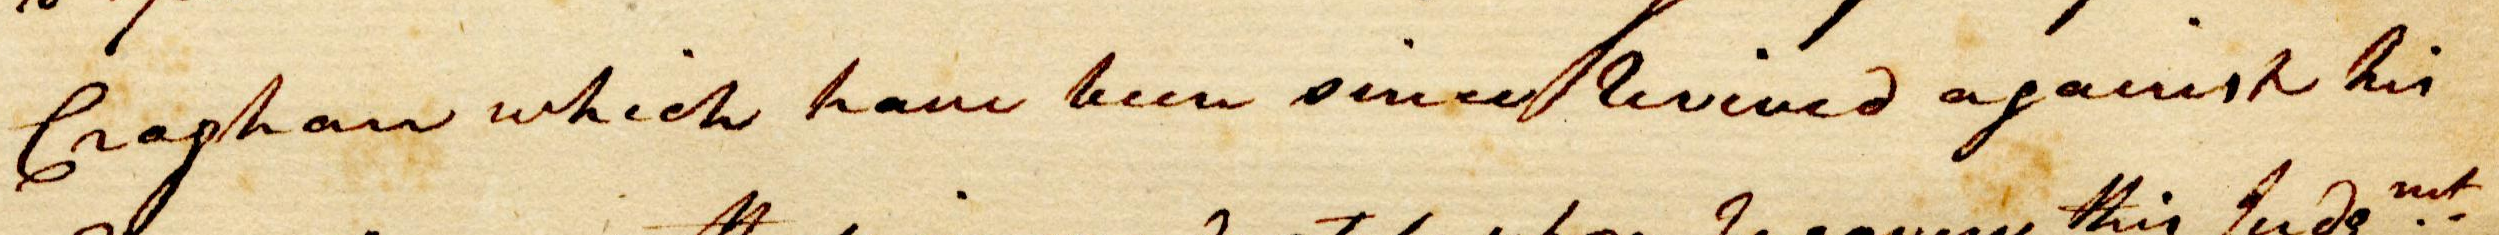Croghan which have been since revived against his
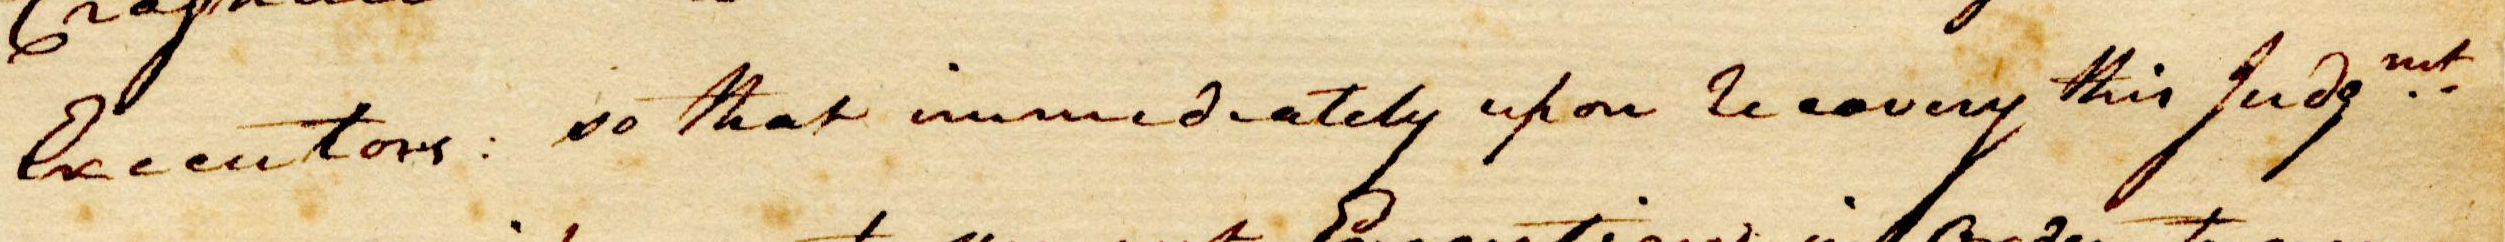Executors: so that immediately upon recovery this Judg^mt.
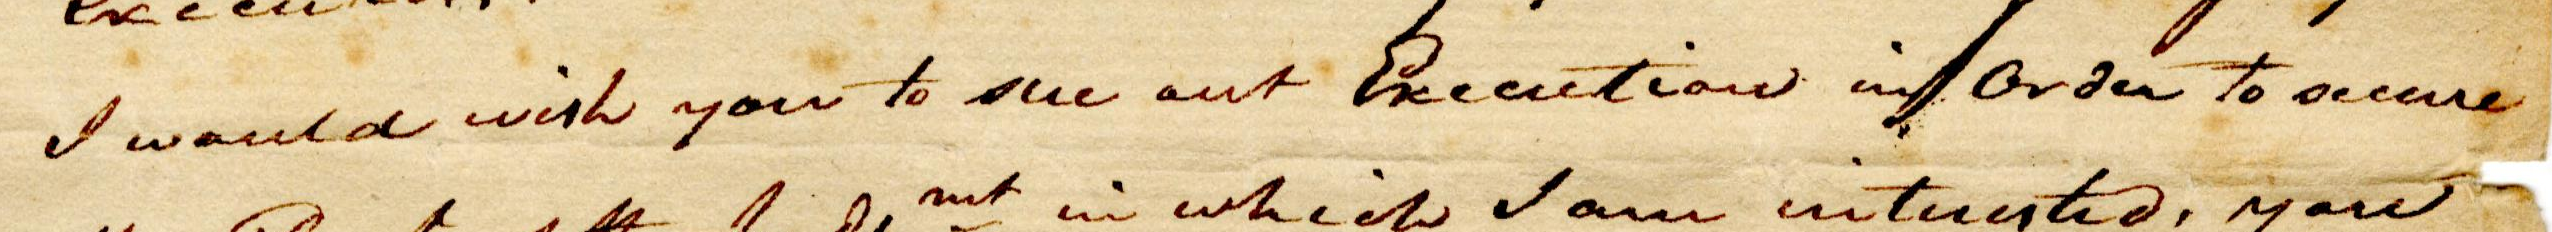I would wish you to sue out Execuctions in order to secure
